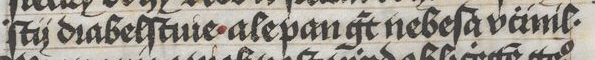ẛtij diabelſtuie.ale pan ḡt nebeſa vċinil.
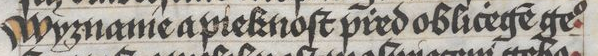Wyznanie a pieknoſt pṙed obliċegē geo.
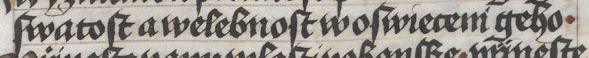ſwatoſt a welebnoſt w oſwieceni geho.
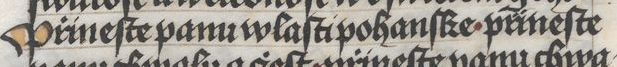Pṙineſte panu wlaſti pohanſke.pṙineſte
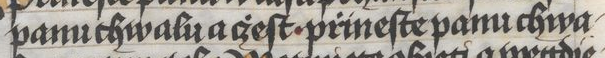panu chwalu a cżeſt.pṙineſte panu chwa¬
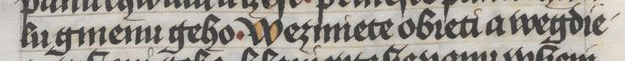lu gmenu geho.Wezmiete obieti a wegdie¬
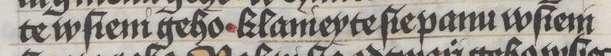te wſiem geho.klanieyte ſie panu wſieni
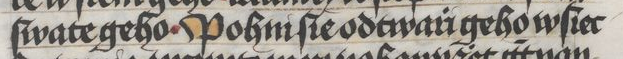ſwate geho.Pohni ſie odtwaṙi geho wſiec¬
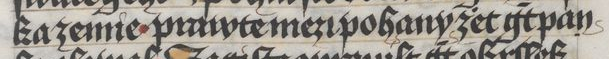ka zemie.prawte mezi pohany żet ḡt pan
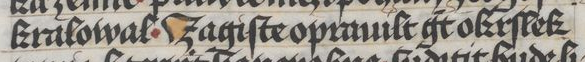kralowal.Zagiſte oprauilt ḡt okrſlek
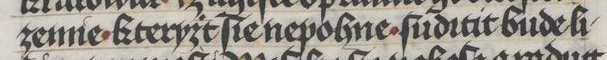zemie.kteryżt ſie nepohne.ſuditit bude li¬
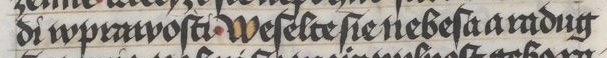di wprawoſti.Weſelte ſie nebeſa a radug
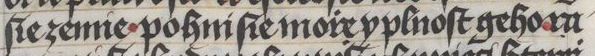ſie zemie.pohni ſie moṙe y plnoſt geho.ra¬
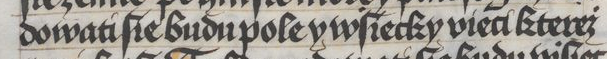dowati ſie budu pole y wẛiecky vieci ktereż
